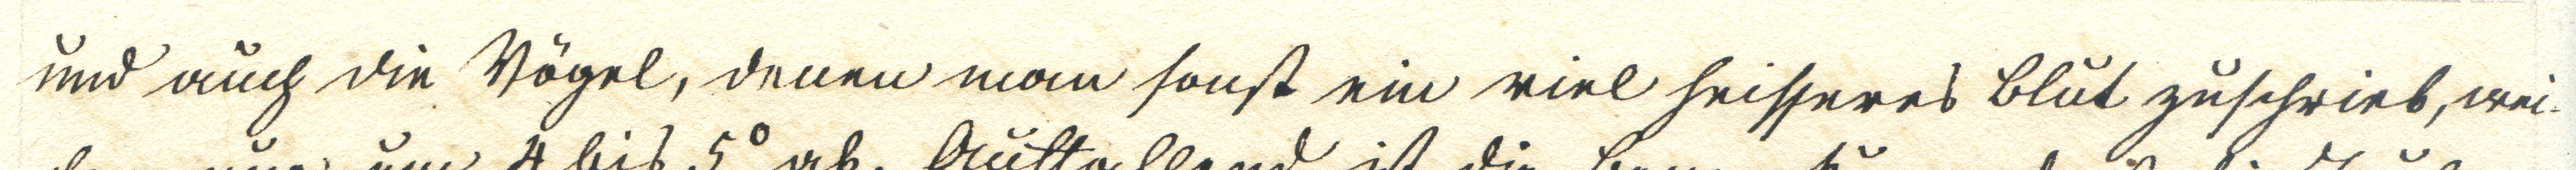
und auch die Vögel, denen man sonst ein viel heisseres Blut zuschrieb, wei-
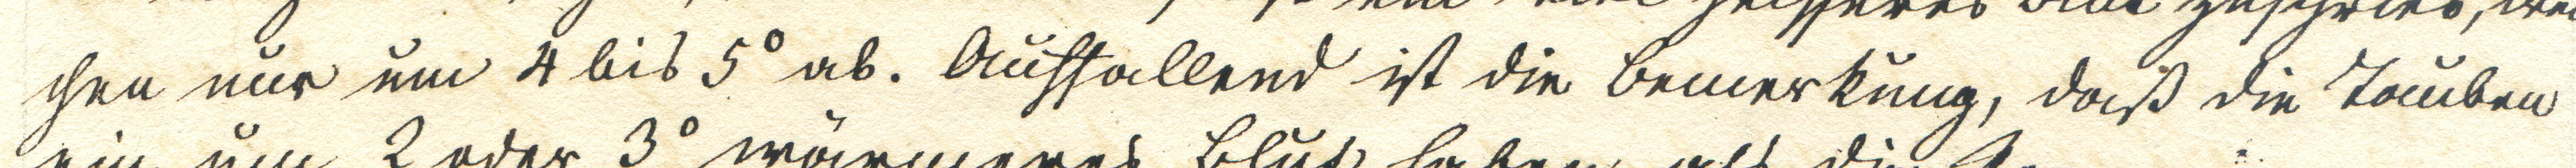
chen nur um 4 bis 5° ab. Auffallend ist die Bemerkung, daß die Tauben
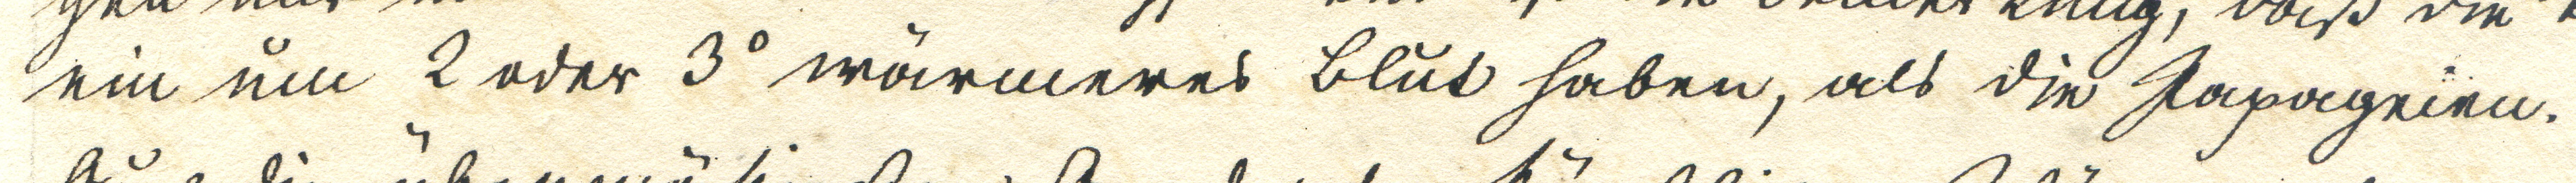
ein um 2 oder 3° wärmeres Blut haben, als die Papageien.
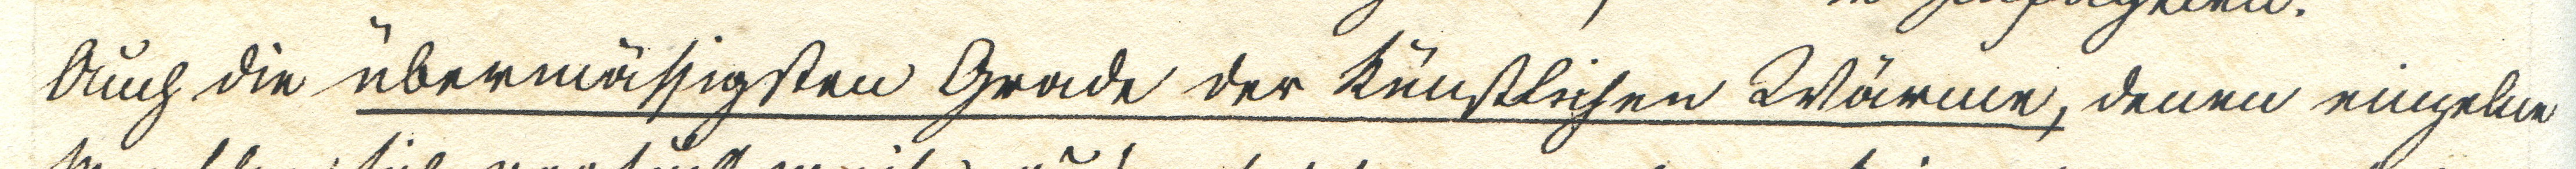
Auch die übermässigsten Grade der künstlichen Wärme, denen einzelne
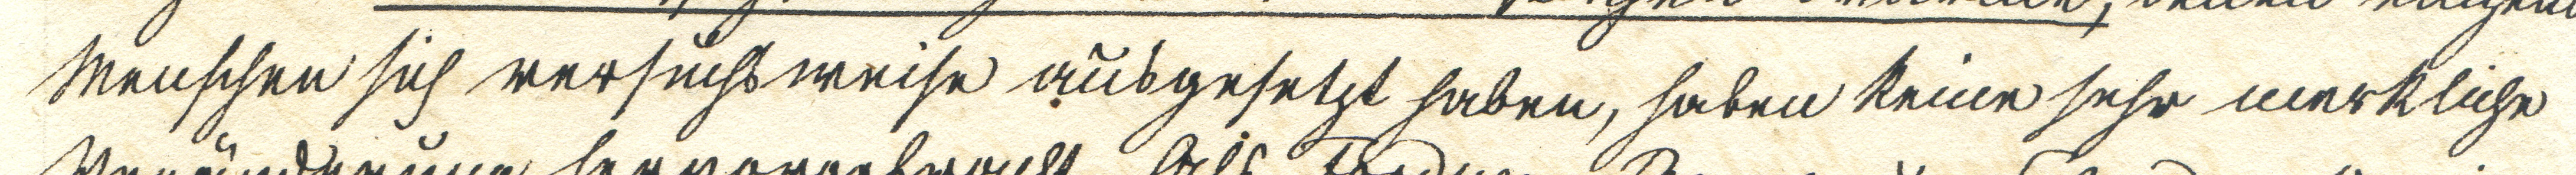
Menschen sich versuchsweise ausgesetzt haben, haben keine sehr merkliche
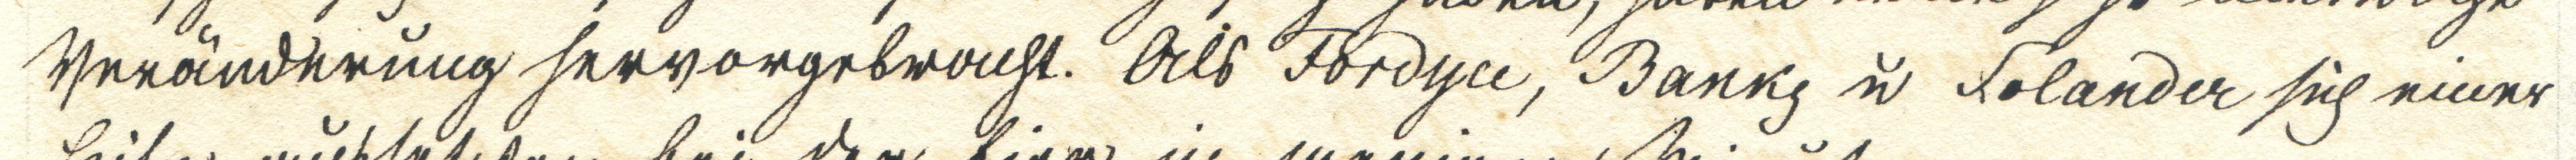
Veränderung hervorgebracht. Als Fordyce, Banks u Solander sich einer
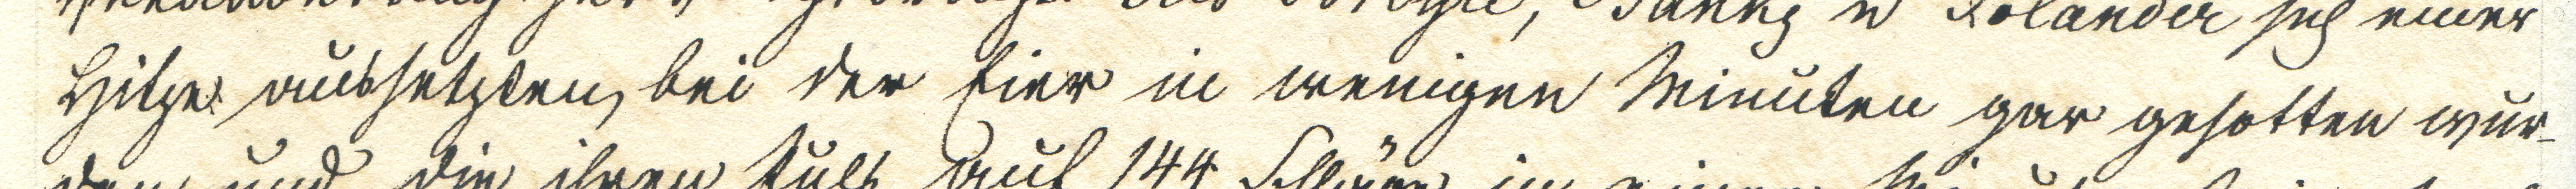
Hitze aussetzten, bei der Eier in wenig Minuten gar gesotten wur-
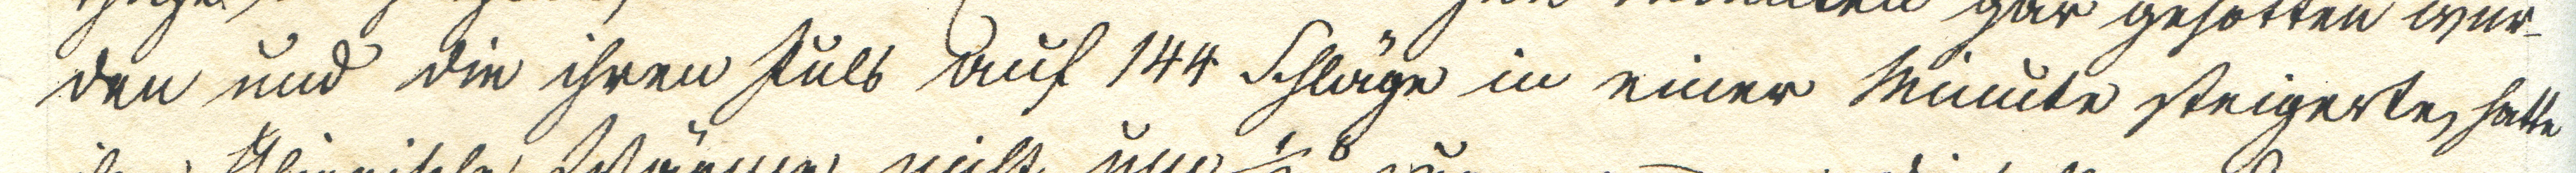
den und die ihren Puls auf 144 Schläge in einer Minute steigerte, hatte
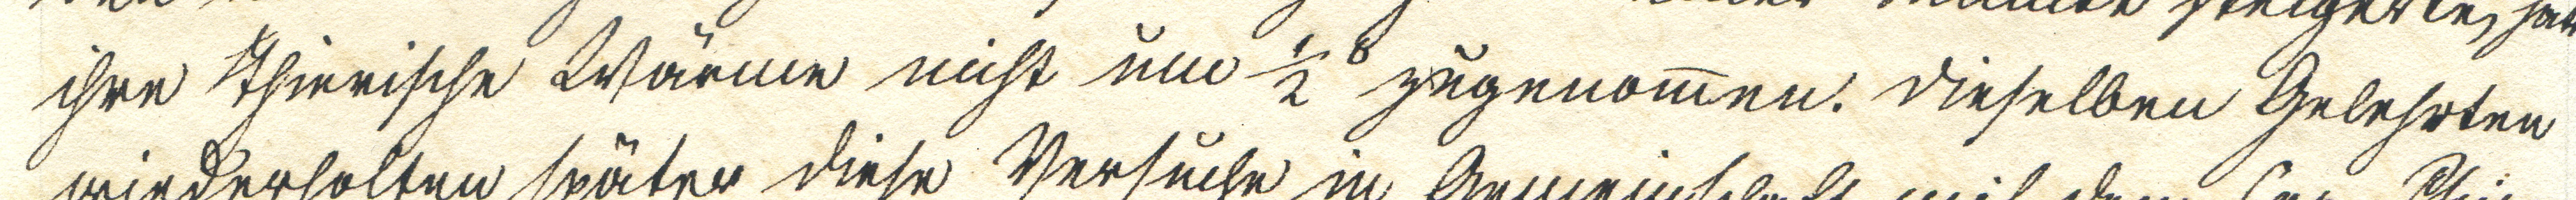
ihre thierische Wärme nicht um ½° zugenom̃en. Dieselben Gelehrten
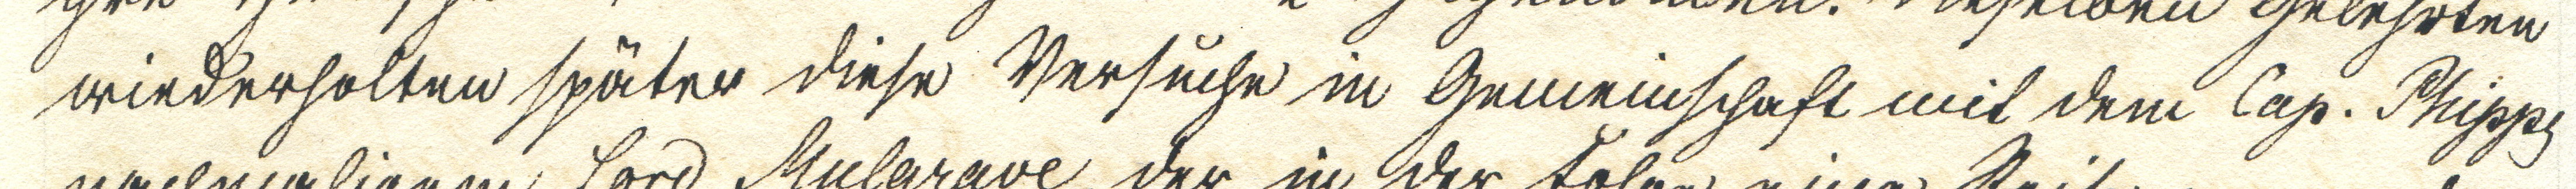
wiederholten später diese Versuche in Gemeinschaft mit dem Cap. Phipps
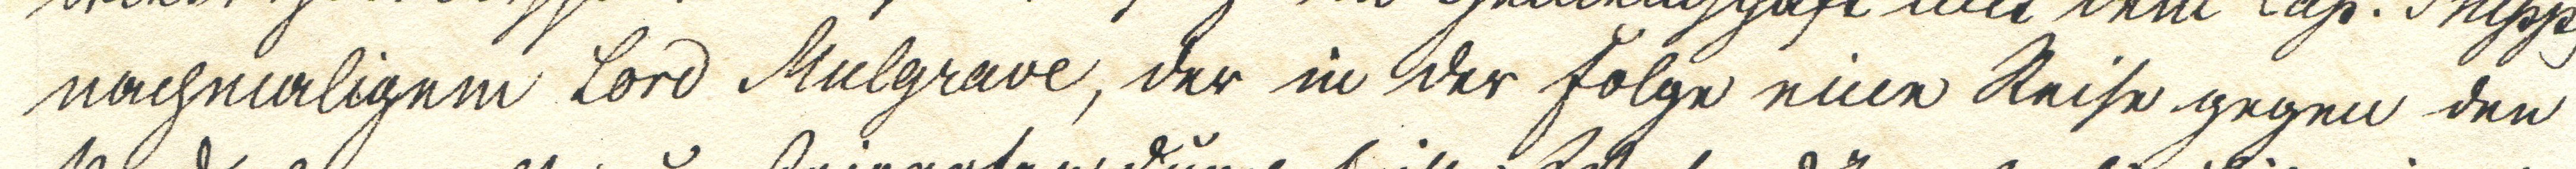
nachmaligen Lord Mulgrave, der in der Folge eine Reise gegen den
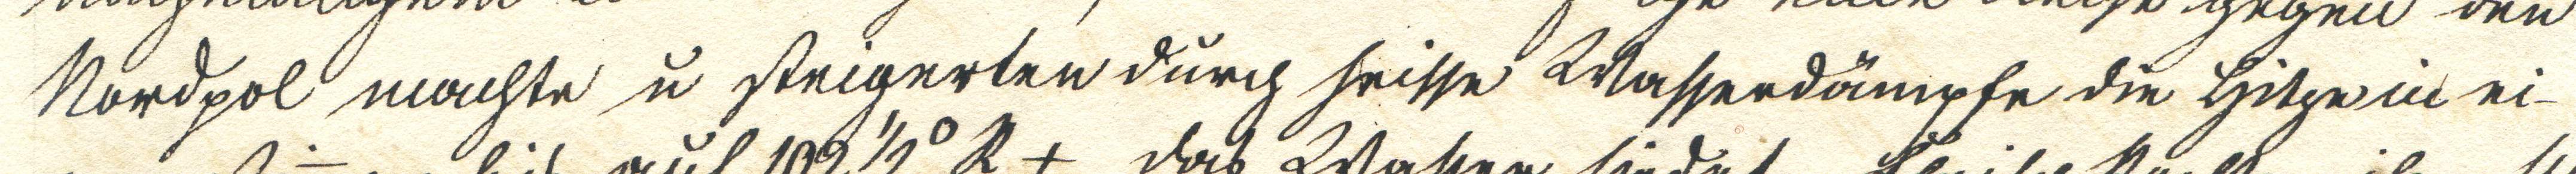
Nordpol machte u steigerten durch heisse Wasserdämpfe die Hitze in ei-
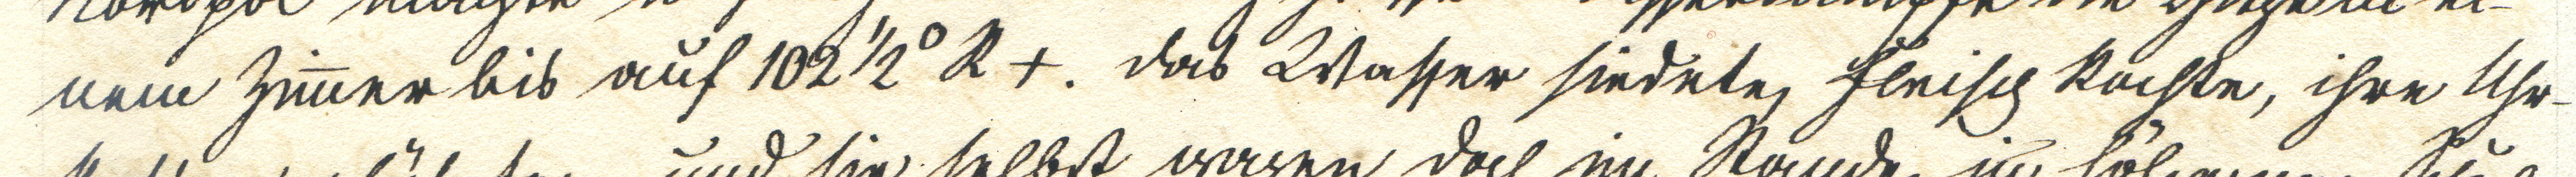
nem Zim̃er bis auf 102½° R+. Das Wasser siedete, Fleisch kochte, ihre Uhr-
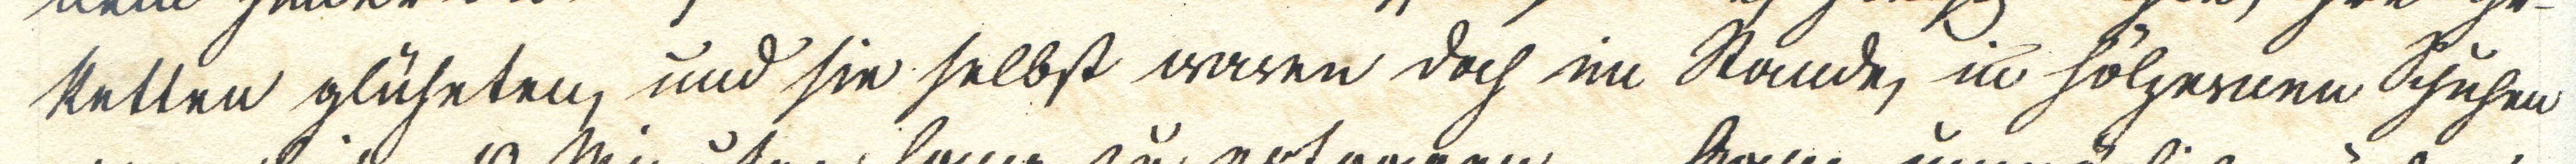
ketten glühten, und sie selbst waren doch im Stande, in hölzernen Schuhen
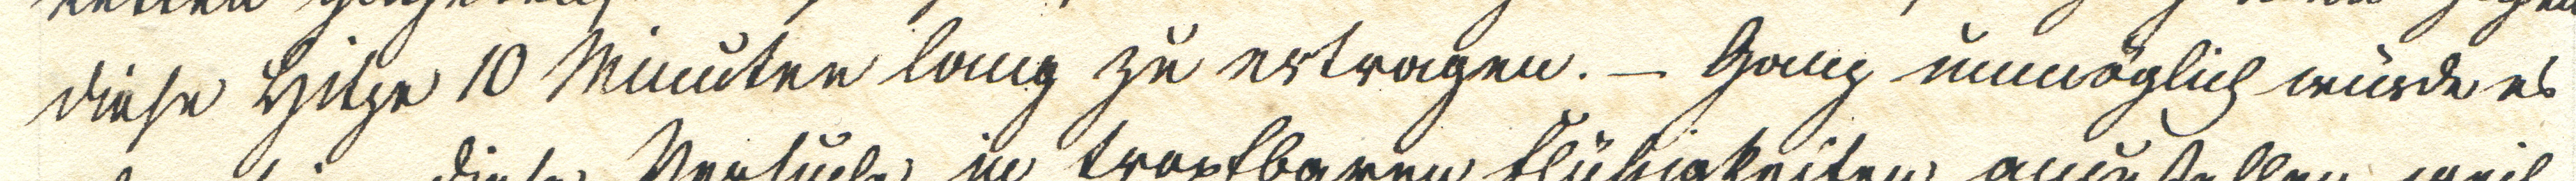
diese Hitze 10 Minuten lang zu ertragen. – Ganz unmöglich würde es
